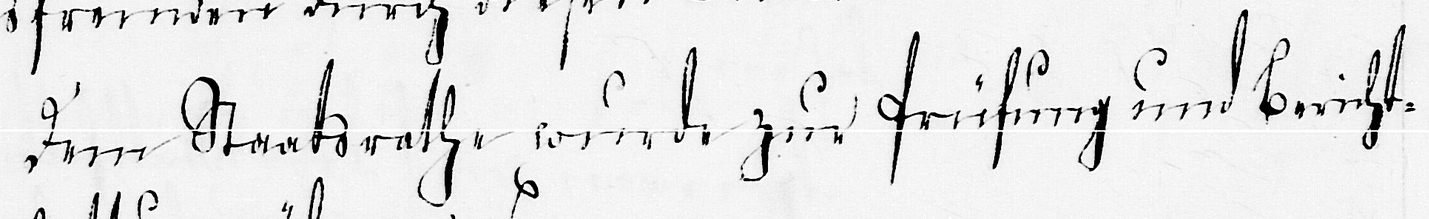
Dem Staatsrathe wurde zur Prüfung und Bericht¬
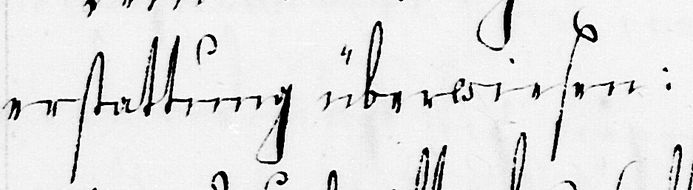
erstattung überwiesen:
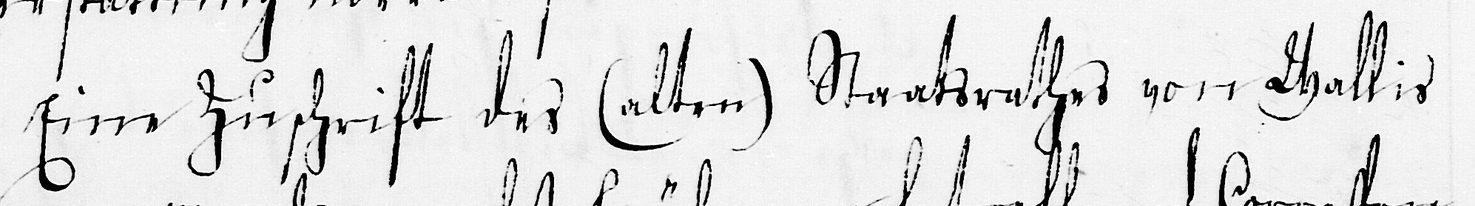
Eine Zuschrift des (alten) Staatsrathes von Wallis
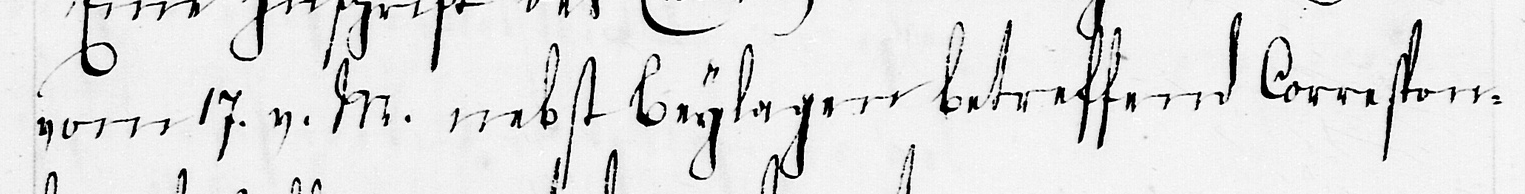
vom 17. v. M. nebst Beylagen betreffend Correspon¬
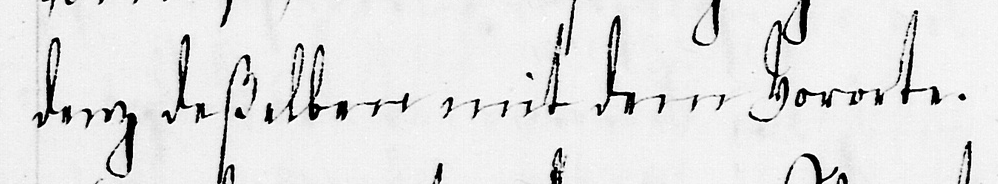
denz deßelben mit dem Vororte.
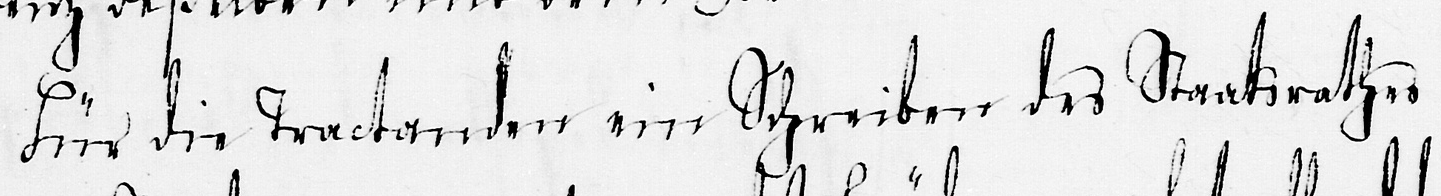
Für die Tractanden ein Schreiben des Staatsrathes
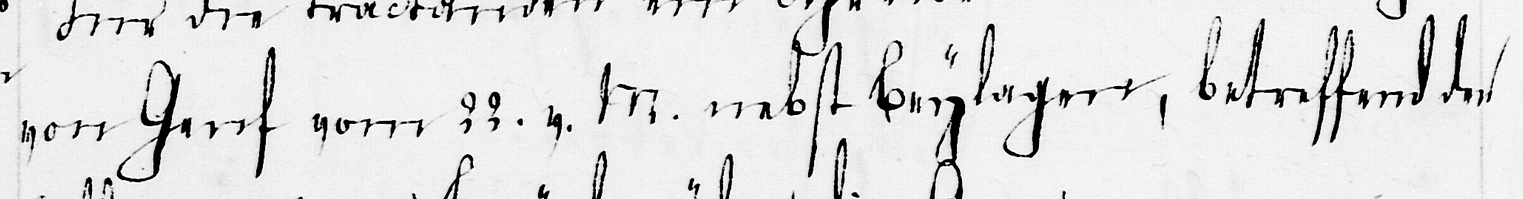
von Genf vom 22. v. M. nebst Beylagen, betreffend den
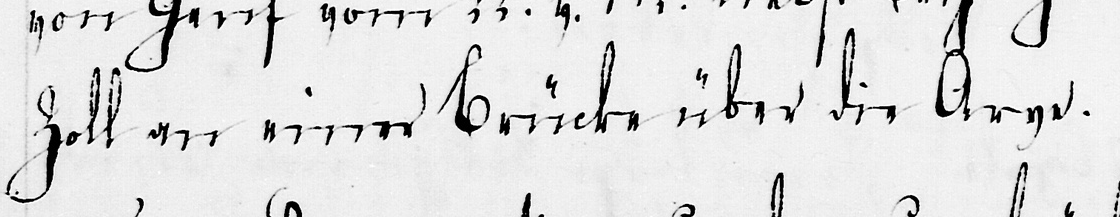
Zoll an einer Brücke über die Arve.
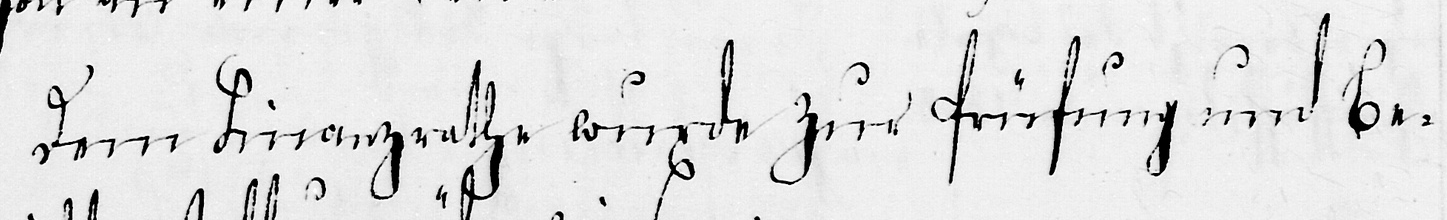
Dem Finanzrathe wurde zur Prüfung und Be¬
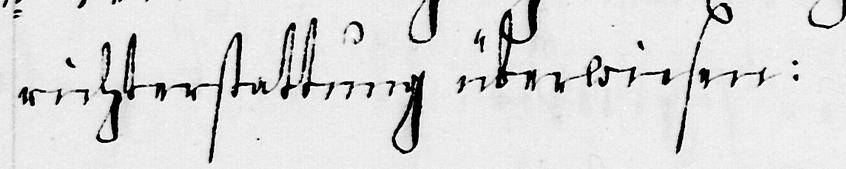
richterstattung überwiesen:
